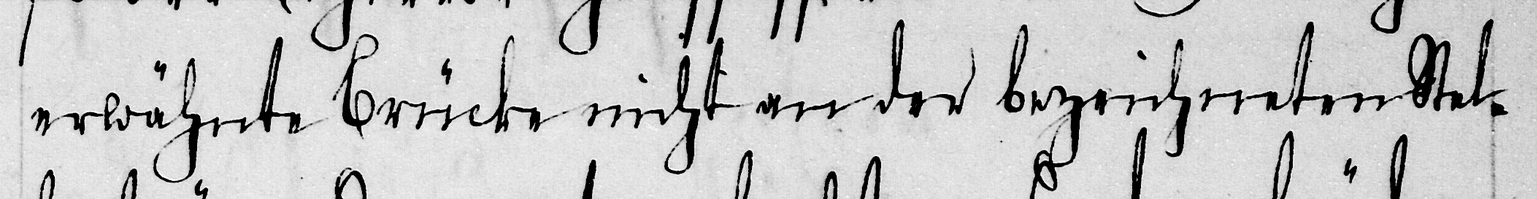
erwähnte Brücke nicht an der bezeichneten Stel¬
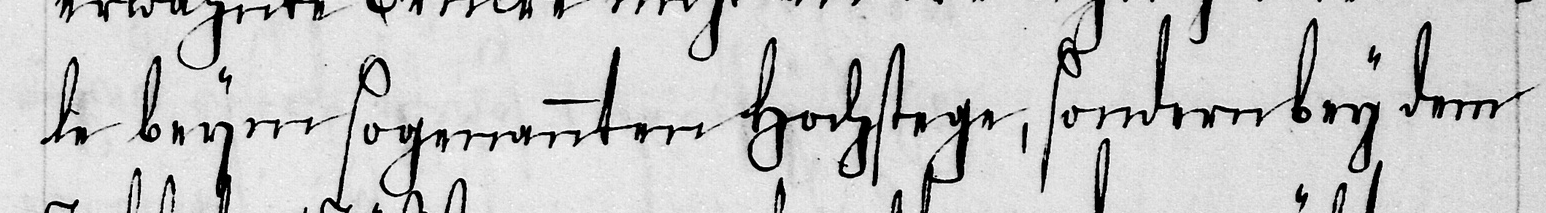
le beym sogenannten Hochstege, sondern bey dem
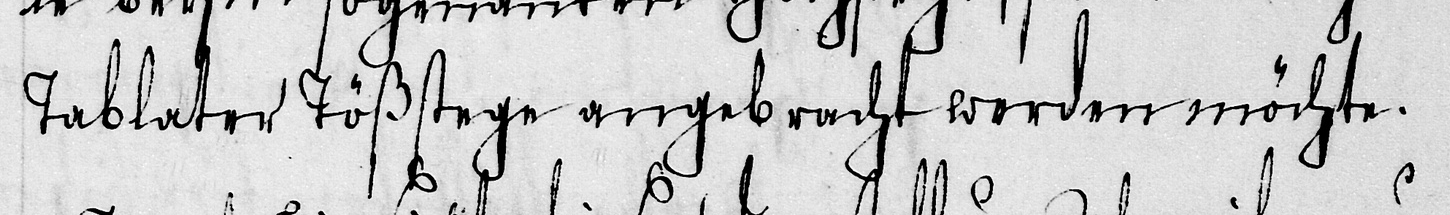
Tablater Tößstege angebracht werden möchte.
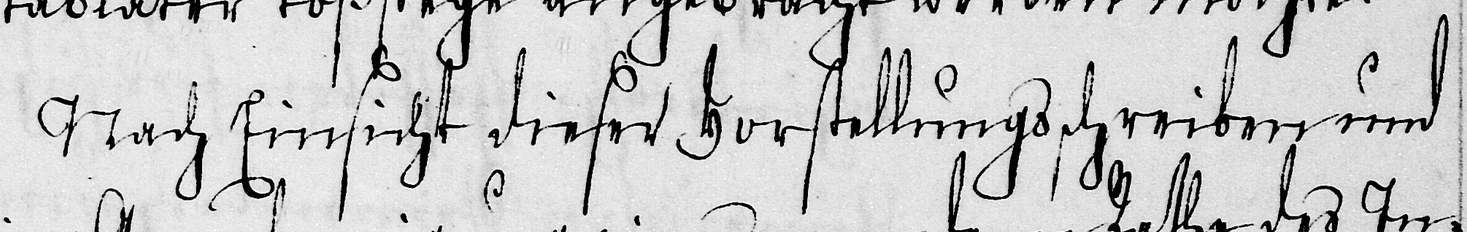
Nach Einsicht dieser Vorstellungsschreiben und
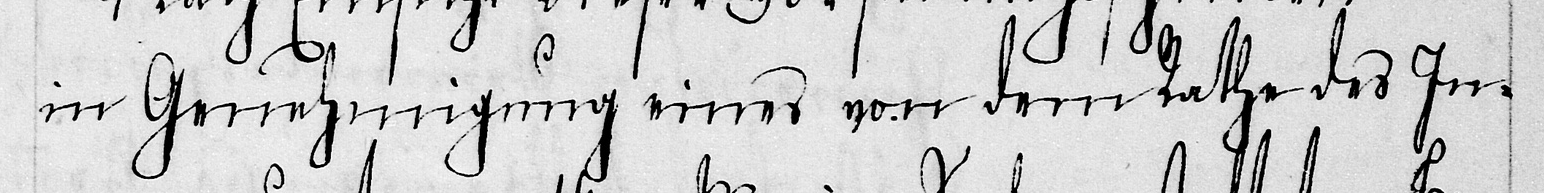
in Genehmigung eines von dem Rathe des In¬
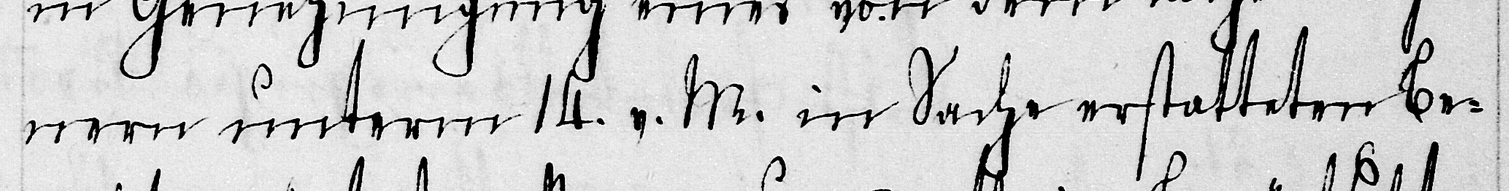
nern unterm 14. v. M. in Sache erstatteten Be¬
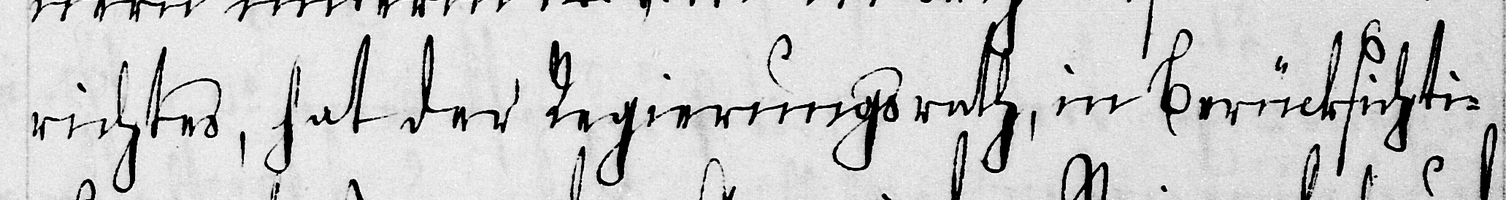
richtes, hat der Regierungsrath, in Berücksichti¬
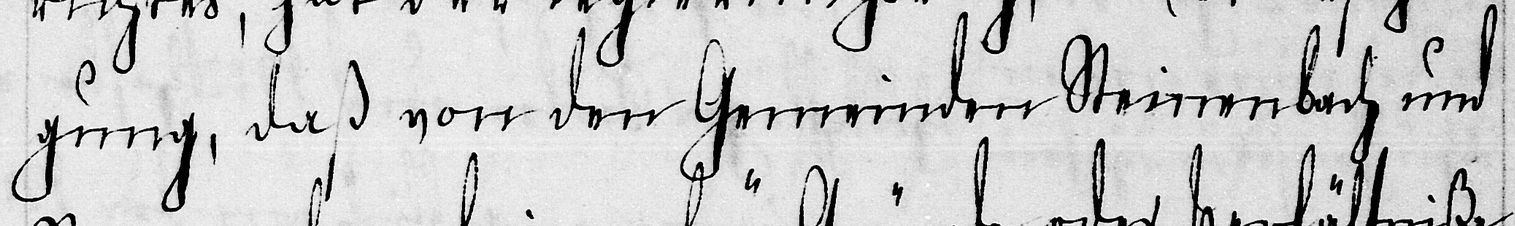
gung, daß von den Gemeinden Steinenbach und
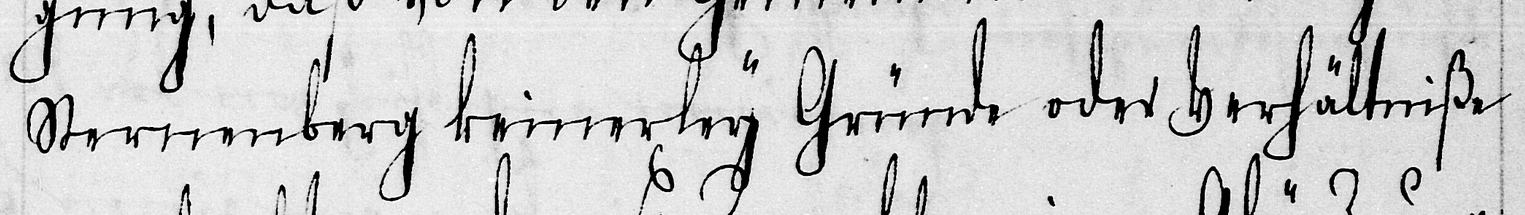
Sternenberg keinerley Gründe oder Verhältniße
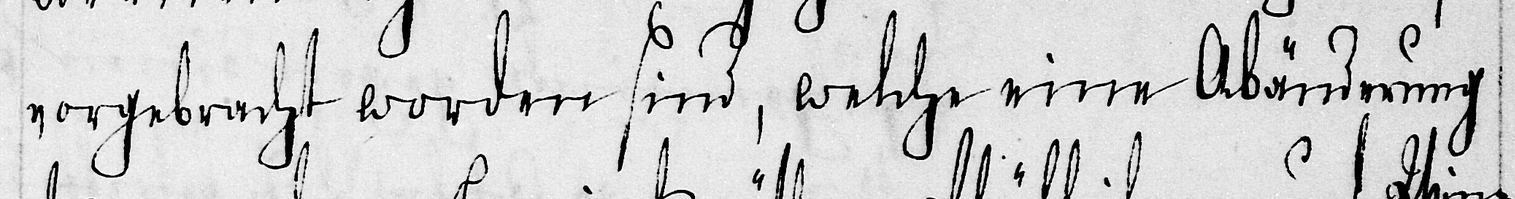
vorgebracht worden sind, welche eine Abänderung
